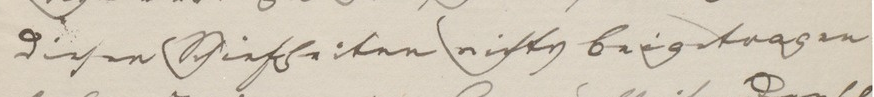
diesen Schiefheiten nichts beigetragen
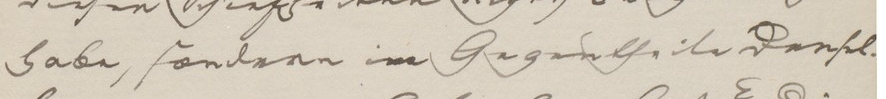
habe, sondern im Gegentheile densel-
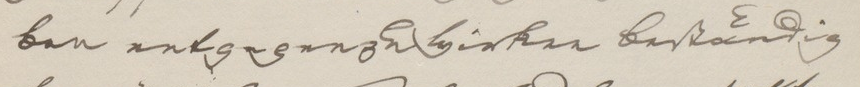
ben entgegenzuwirken beständig
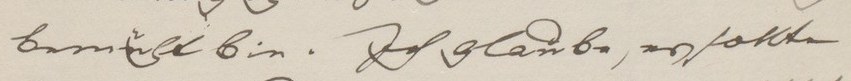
bemüht bin. Ich glaube, es sollte
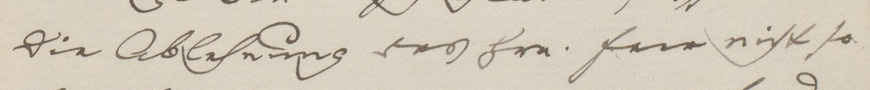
die Ablehnung des Hrn. Feer nicht so
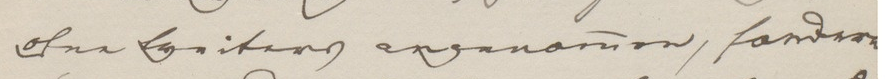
ohne weiters angenommen, sondern
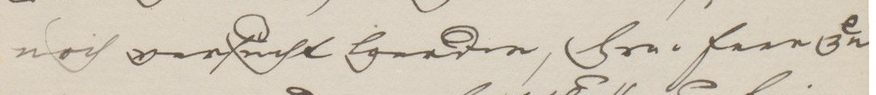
noch versucht werden, Hrn. Feer zu
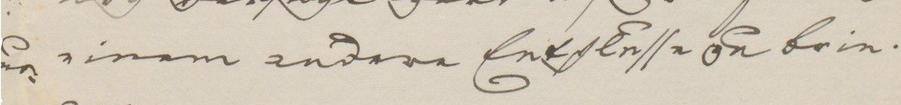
einem andern Entschlusse zu brin-
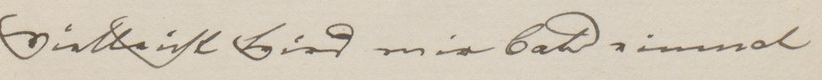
Vielleicht wird mir bald einmal
